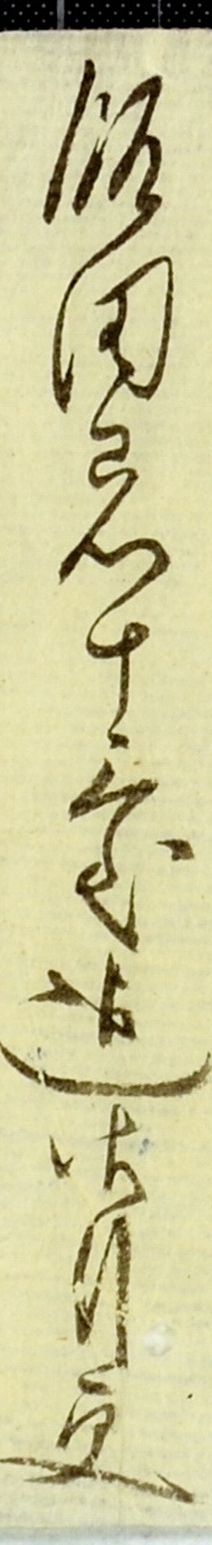飯田着十三匁迄御引受
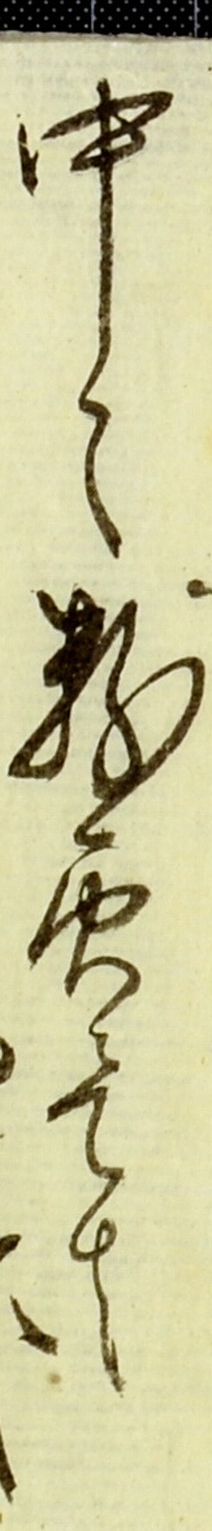中々粉灰にては
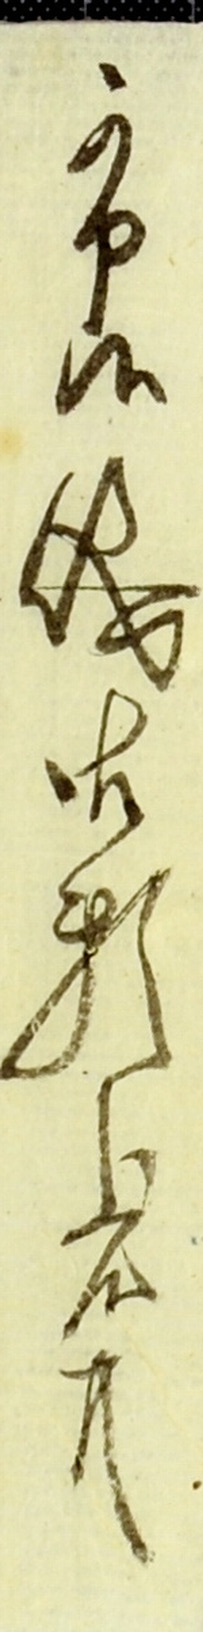可申候儀御頼上候共
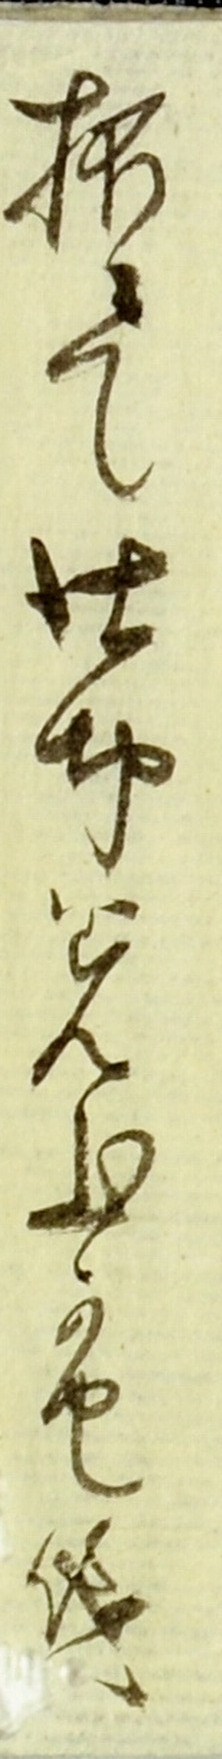抔にて仕切差上可申候儀
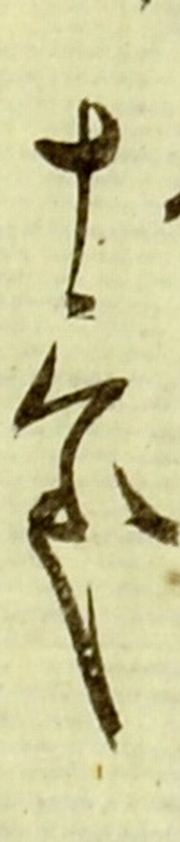十三匁
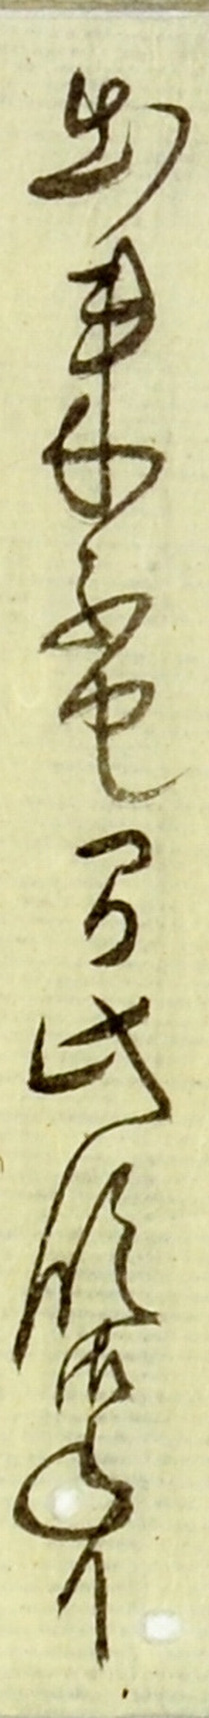出来不申候間此段御承引
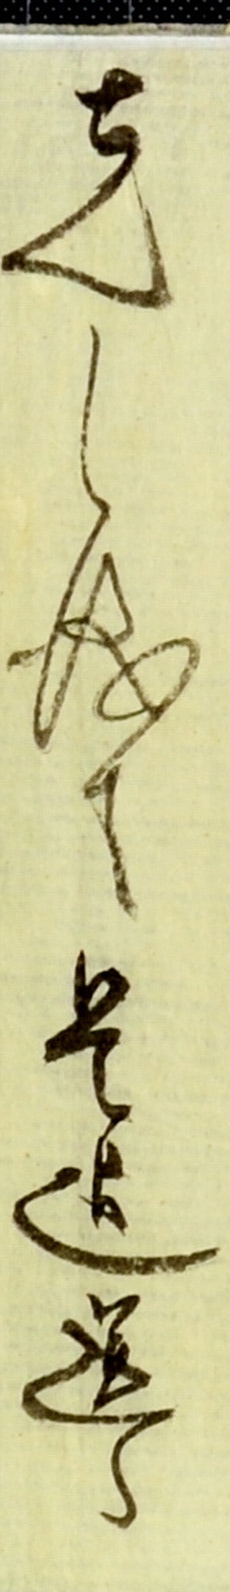ちん之儀は是迄送り
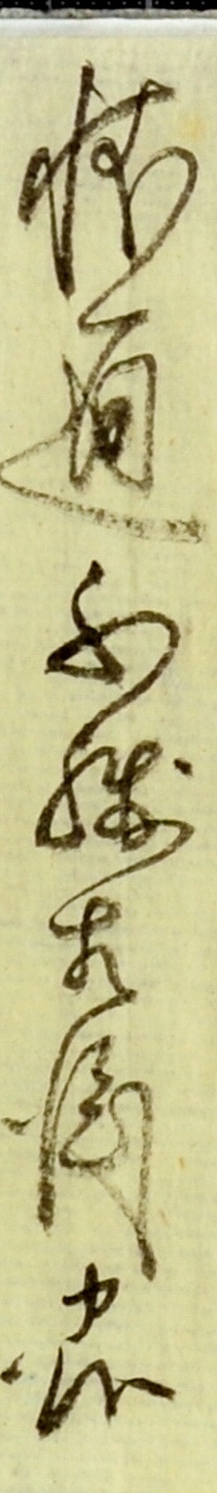状通不残相渡し申候
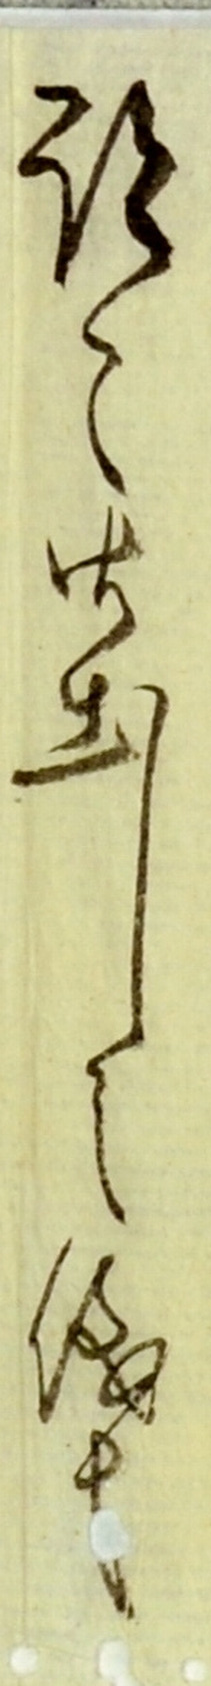跡々御出し之儀は
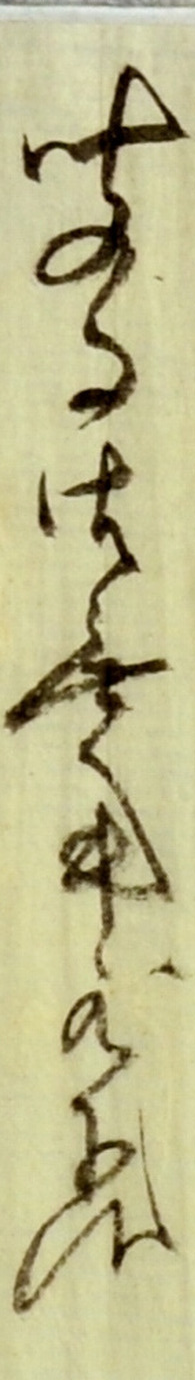決て御無用可被下候
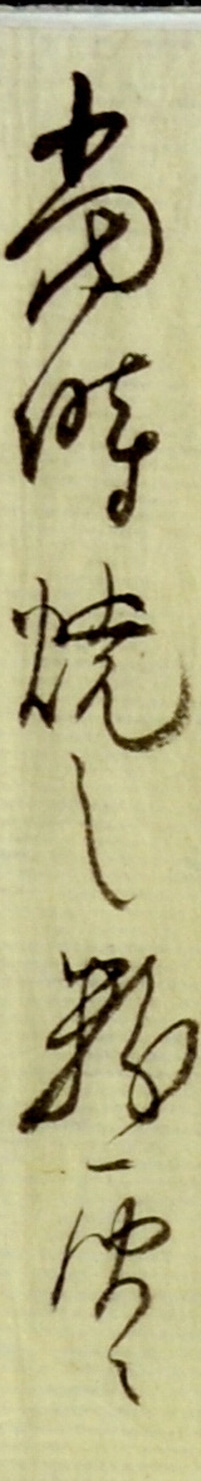当時焼之粉灰に
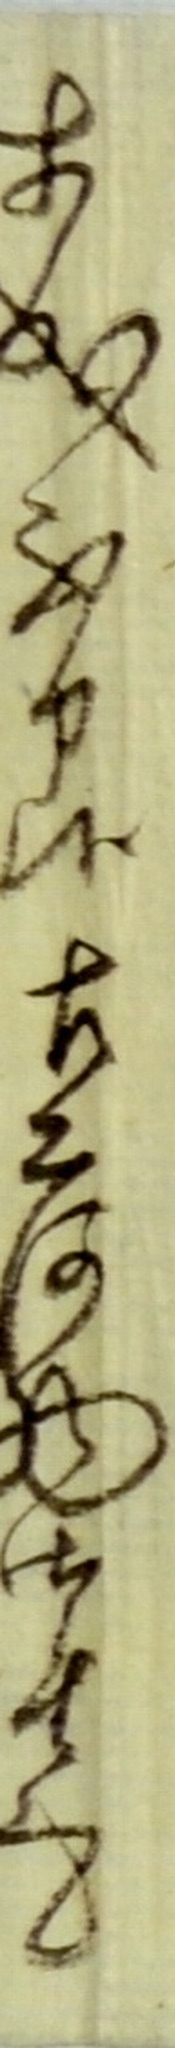相成不申候御荷物御頼上候

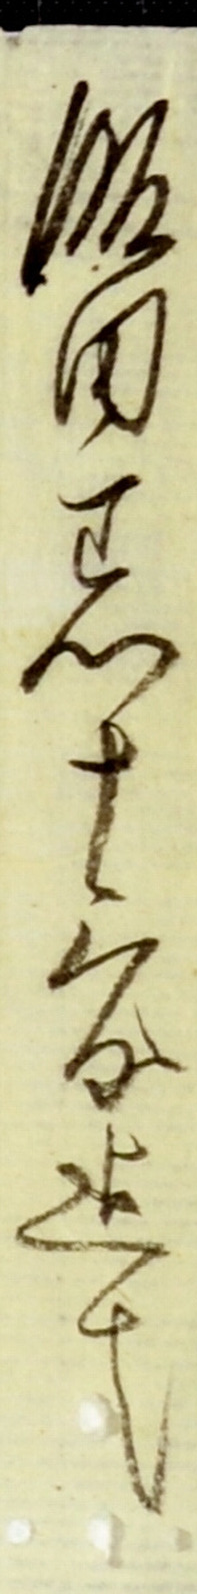飯田着十三日迄は
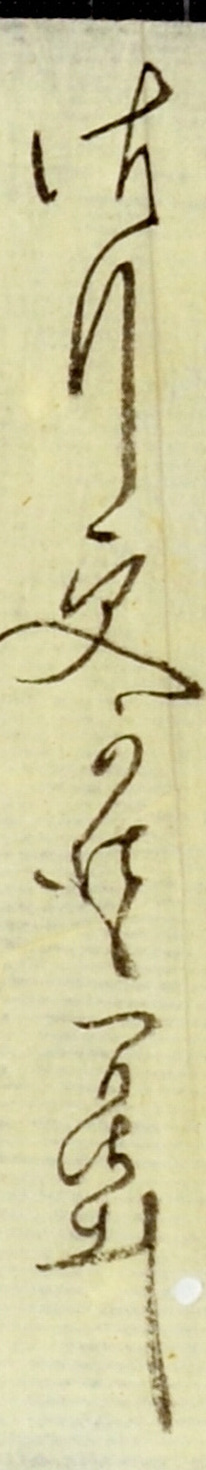御引受可仕候間御出し
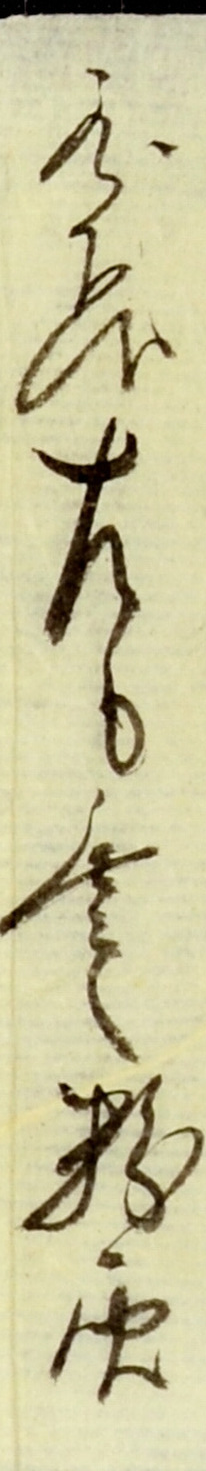可被下候左も無之粉灰
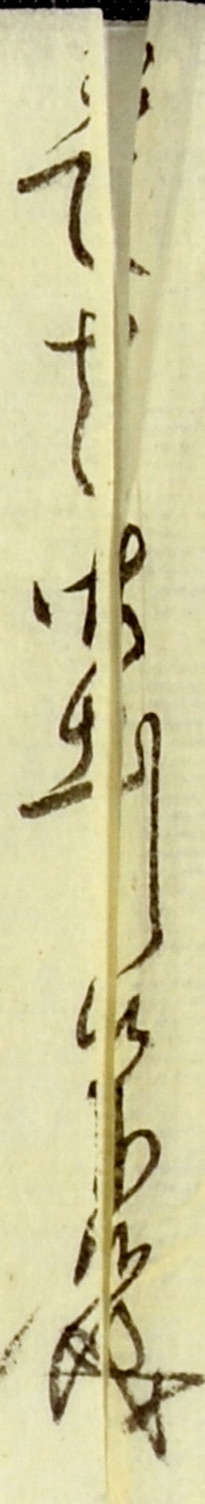にては御出し被下候儀
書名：書状
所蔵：伊那市立高遠町図書館・合同会社AMANE
